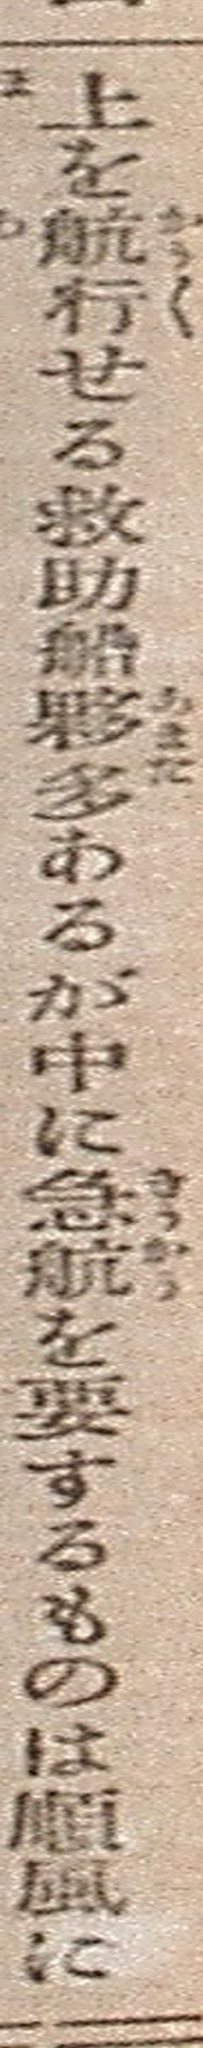上を航行せる救助船夥多あるが中に急航を要するものは順風に
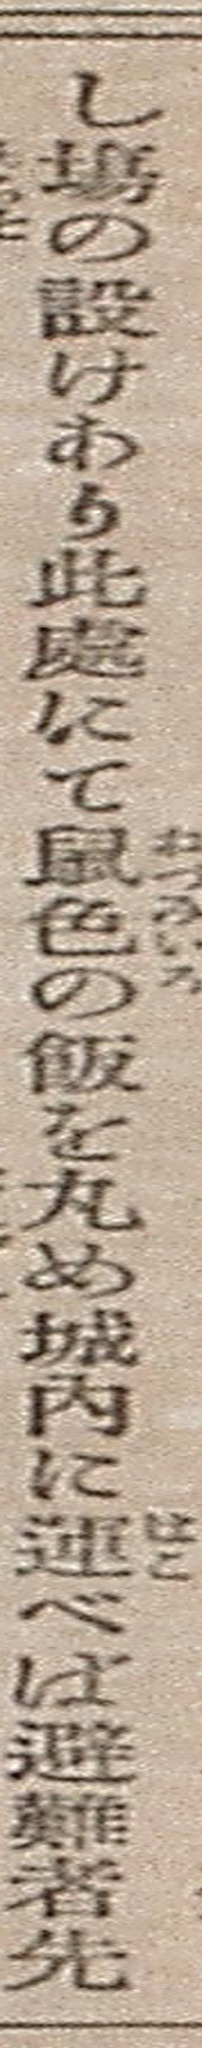し場の設けあり此処にて鼠色の飯を丸め城内に運べば避難者先
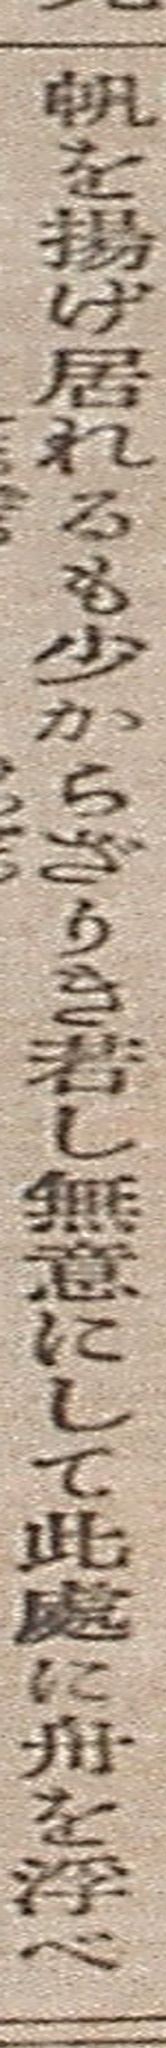帆を揚げ居れるも少からざりき若し無意にして此処に船を浮べ
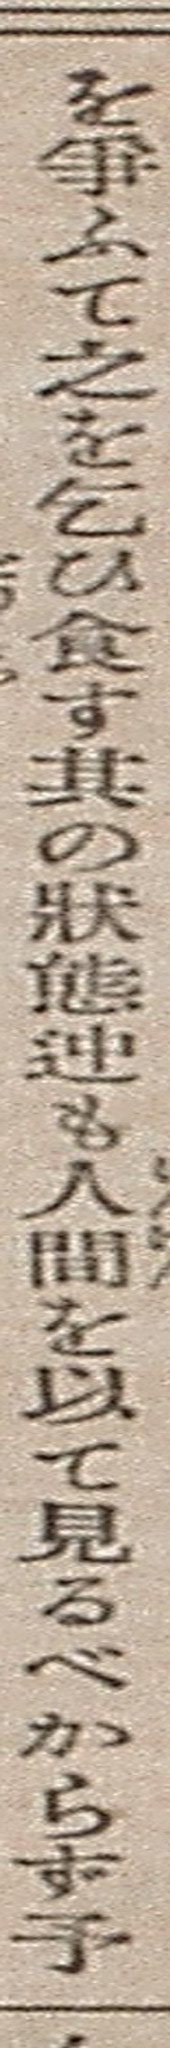を争ふて之を乞ひ食す其の状態迚も人間を以て見るべからず予
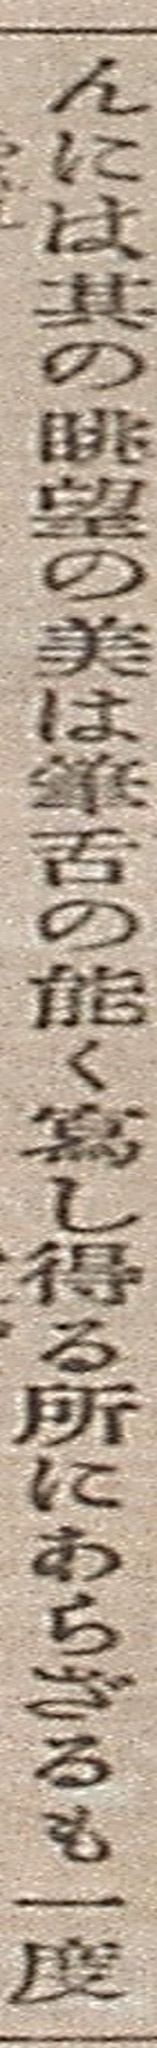んには其の眺望の美は筆舌に能く写し得る所にあらざるも一度
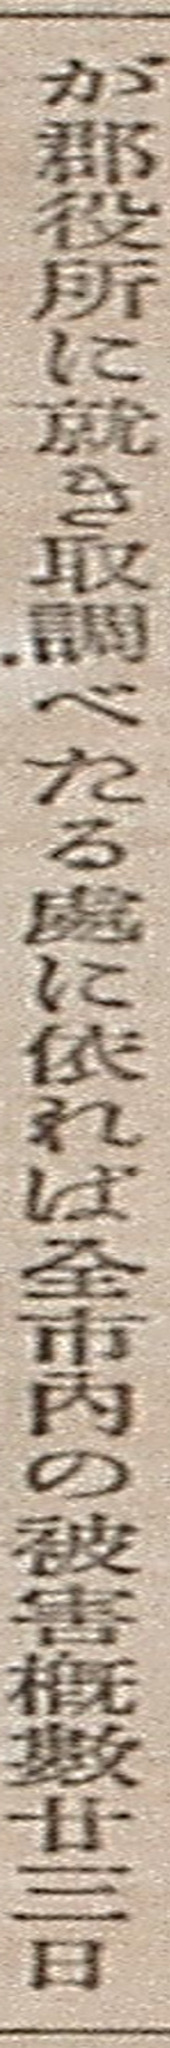が郡役所に就き取調べたる処に依れば全市内の被害概数廿三日
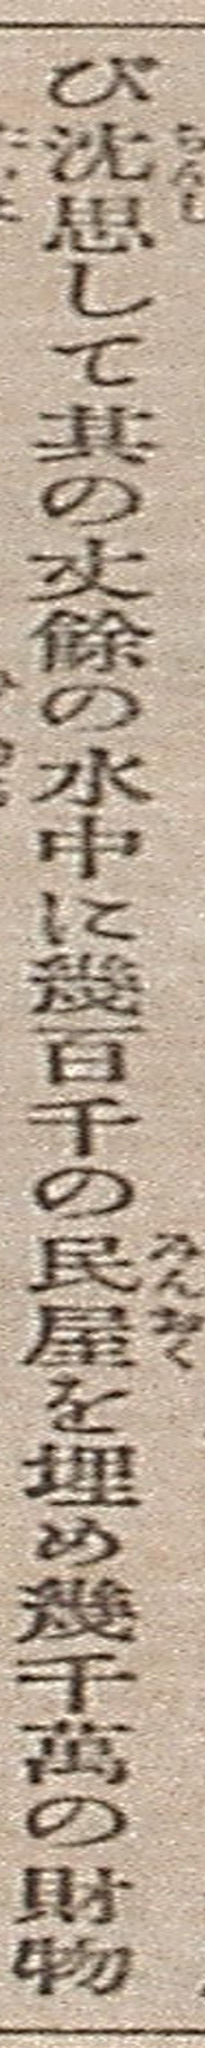び沈思して其の丈餘の水中に幾百千の民屋を埋め幾千萬の財物
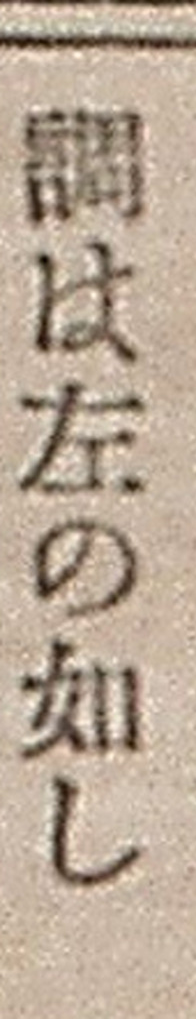調は左の如し
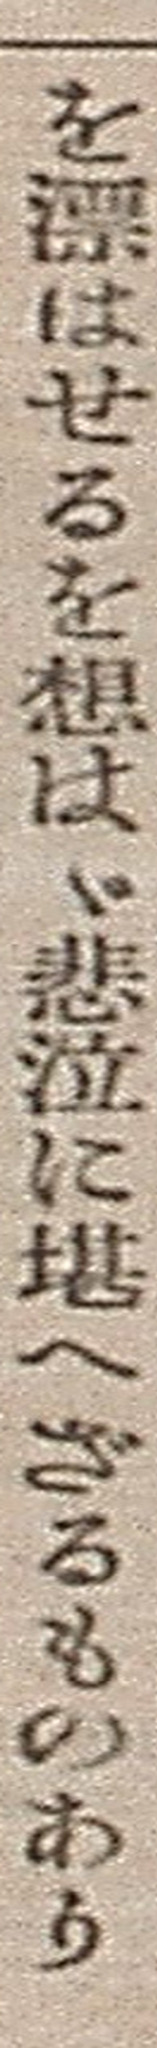を漂はせるを想はゞ悲泣に堪へざるものあり
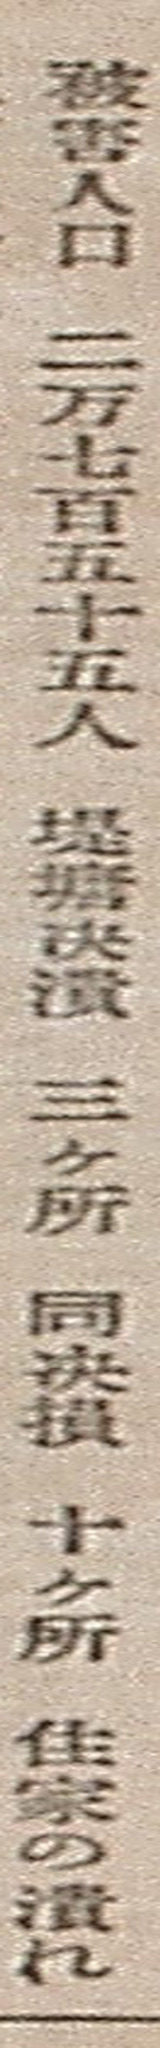被害人口二万七百五十五人堤塘决潰三ヶ所同决損十ヶ所住家の潰れ
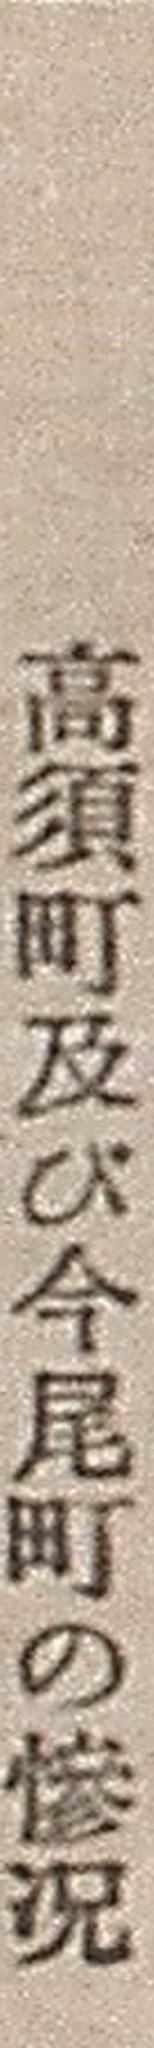高須町及び今尾町の惨況
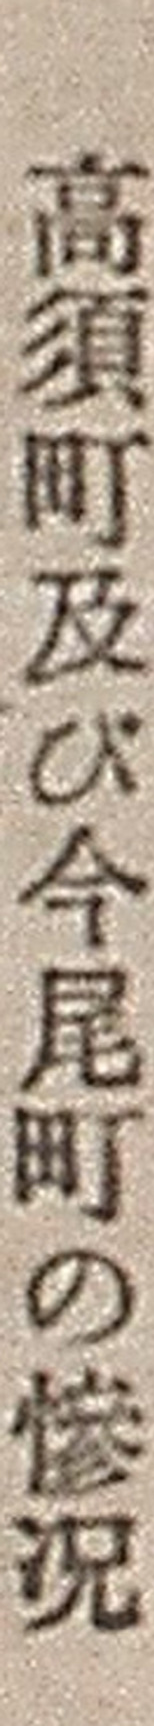高須町及び今尾町の惨況
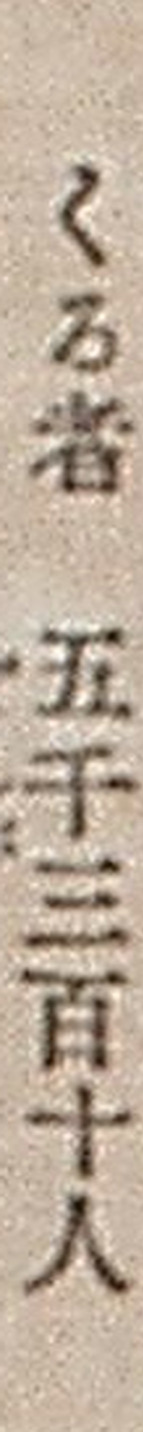くる者五千三百十人
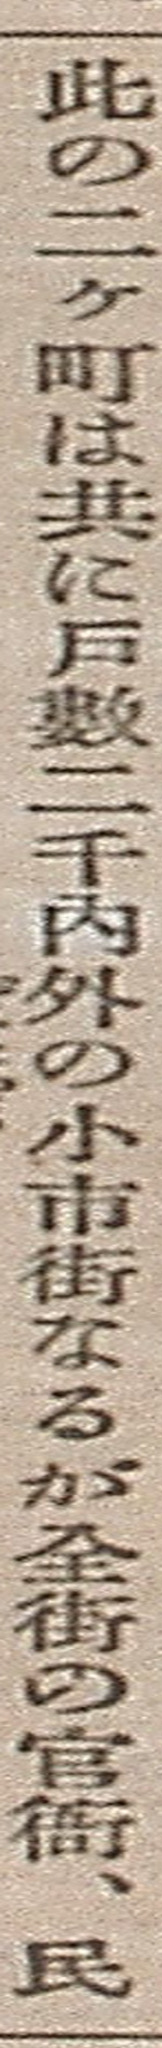此の二ヶ町は共に戸数二千内外の小市街なるが全街の官衛、民
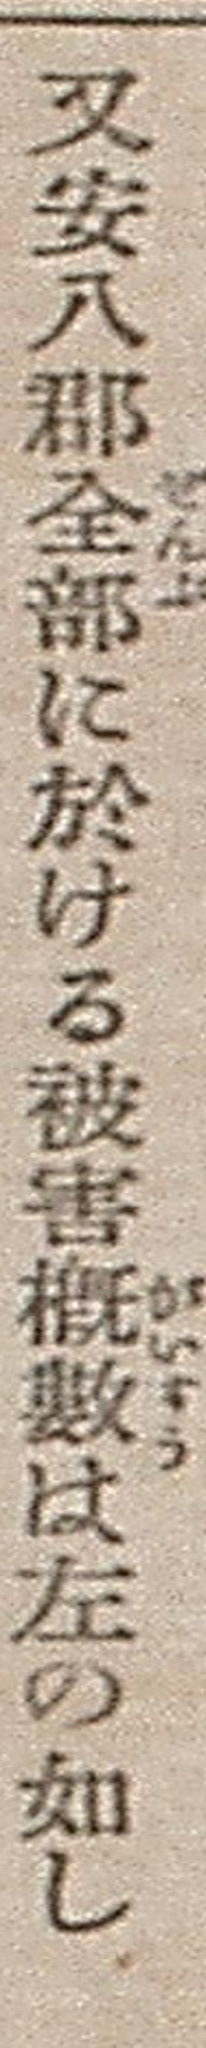又安八郡全部に於ける被害概数は左の如し
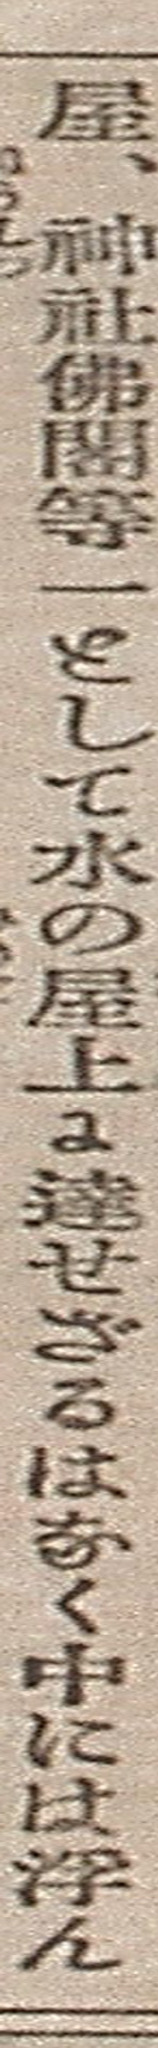屋、神社仏閣等一として水の屋上に達せざるはなく中には浮ん
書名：風俗畫報臨時増刊第百二十六號　洪水被害録（中）
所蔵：東京大学地震研究所図書室 Earthquake Research Institute Library, The University of Tokyo, JAPAN
